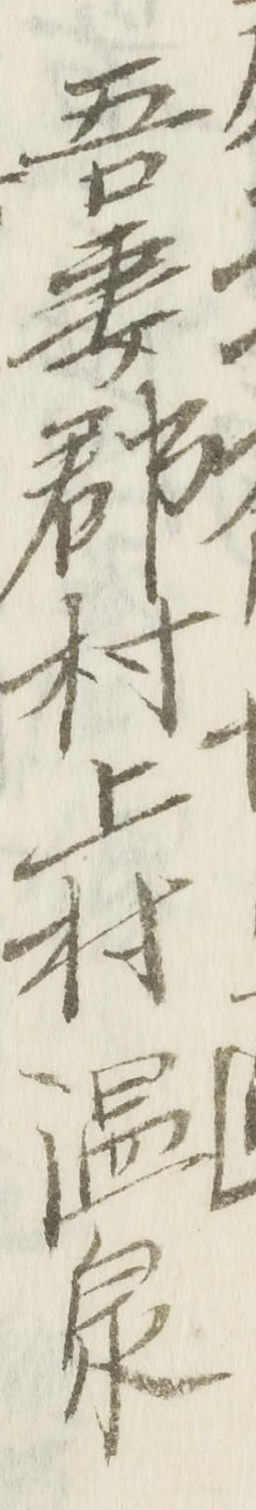吾妻郡村上村温泉
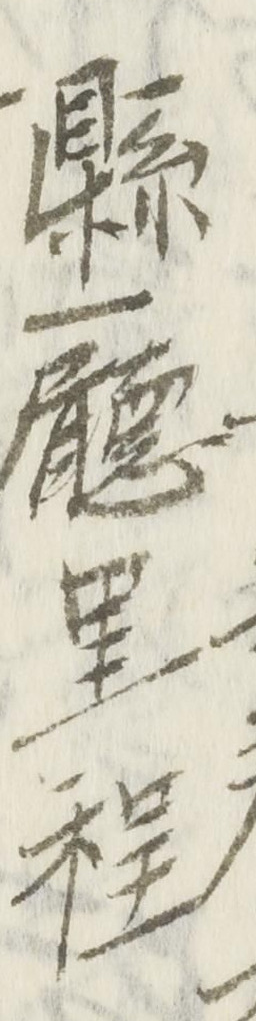県庁里程
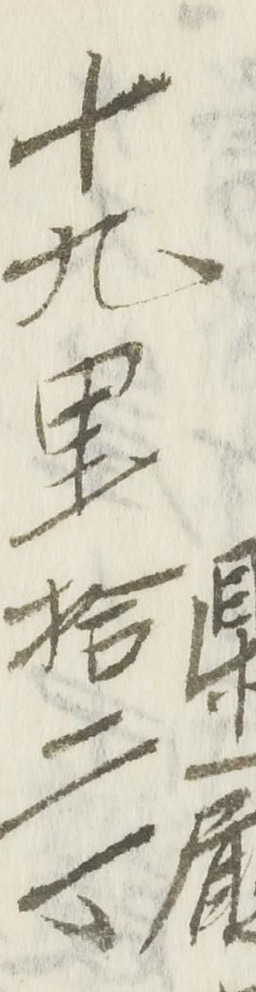十九里拾二丁
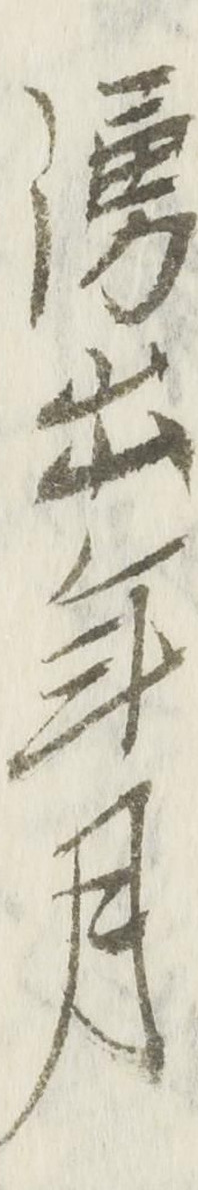湧出年月
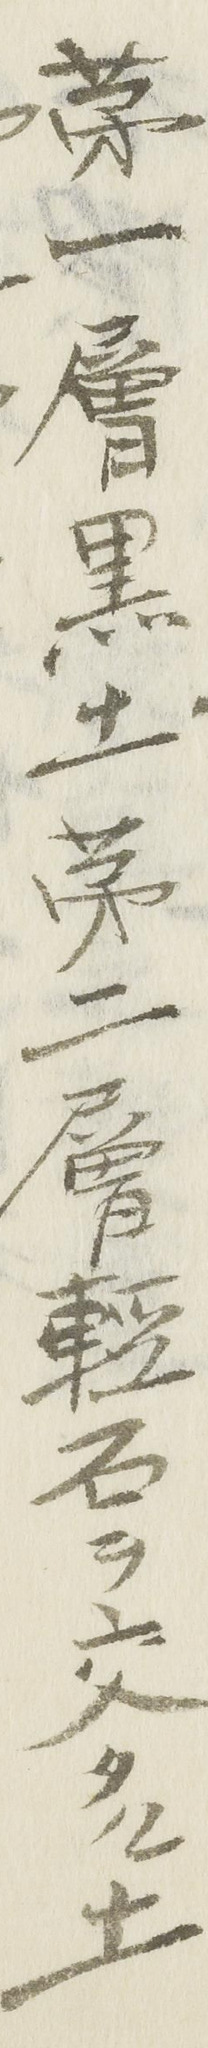第一層黒土第二層軽石ヲ交タル土
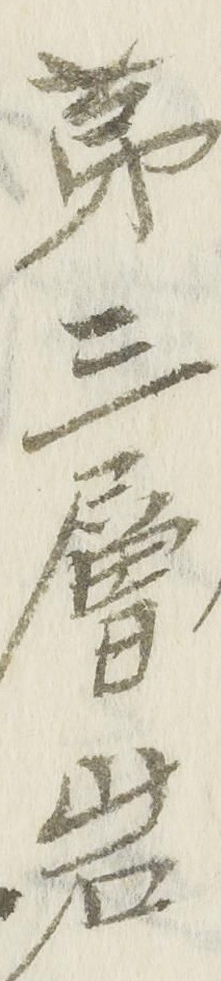第三層岩
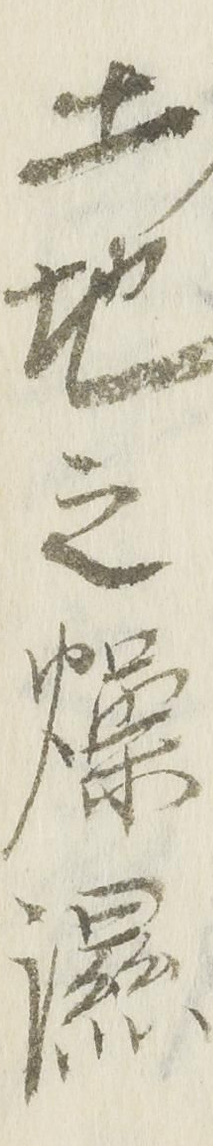土地之燥湿

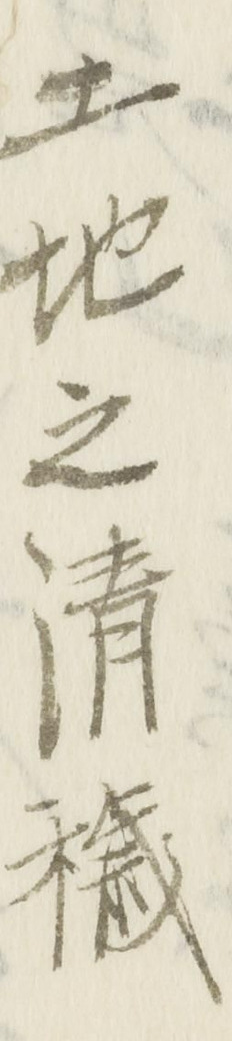土地之清穢
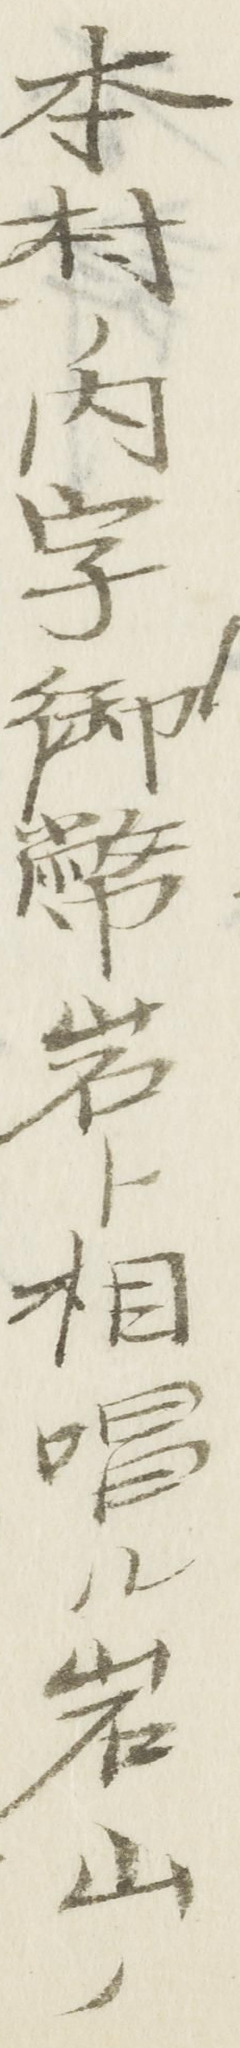本村ノ内字御幣岩ト相ト唱ル岩山ノ
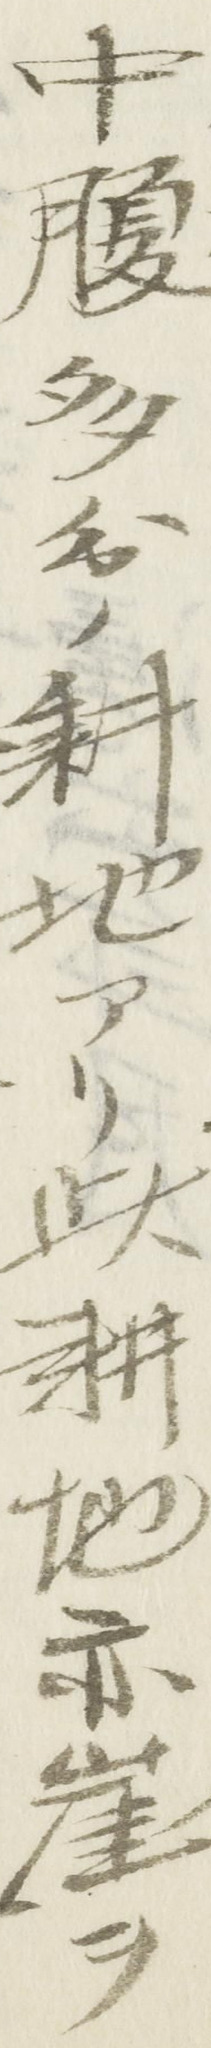中腹多分耕地アリ此耕地亦崖ヲ
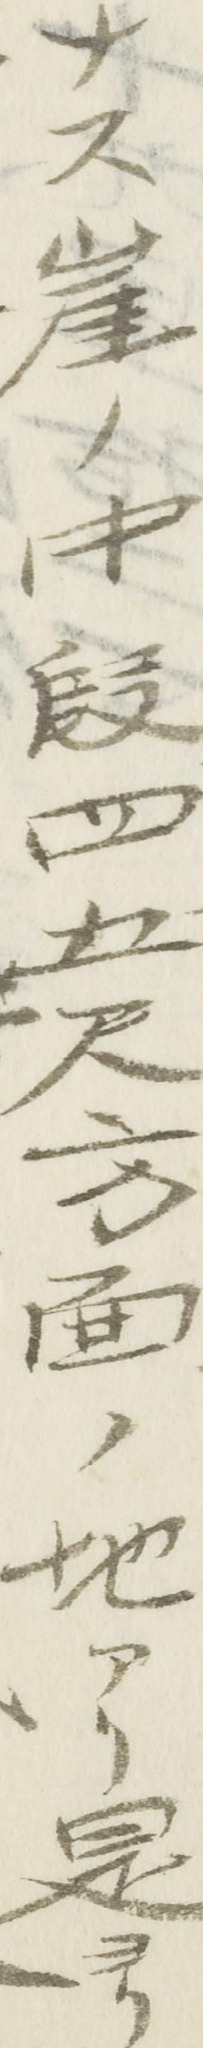ナス崖ノ中段四五尺方面ノ地アリ是トリ
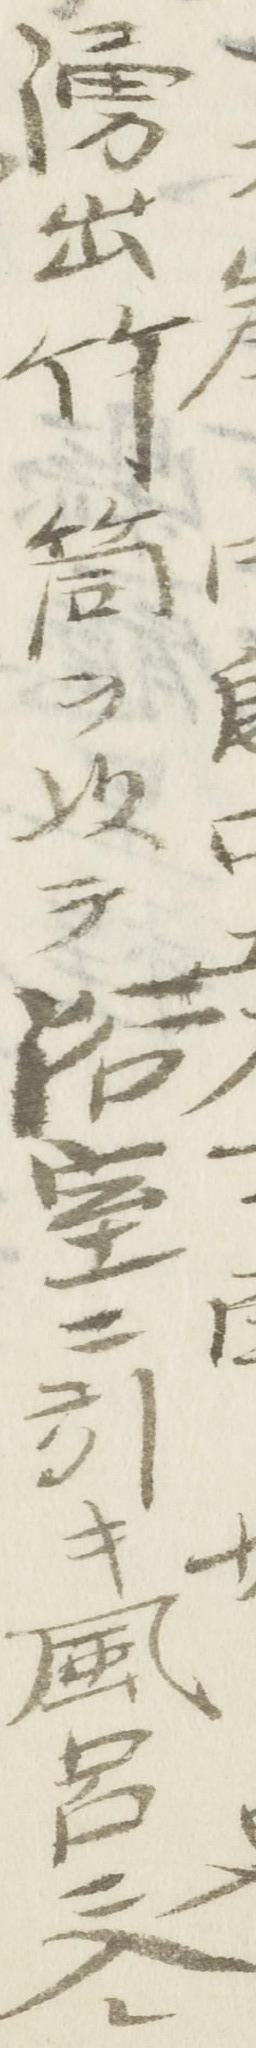湧出竹筒ヲ以テ浴室ニ引キ風呂ニ入レ
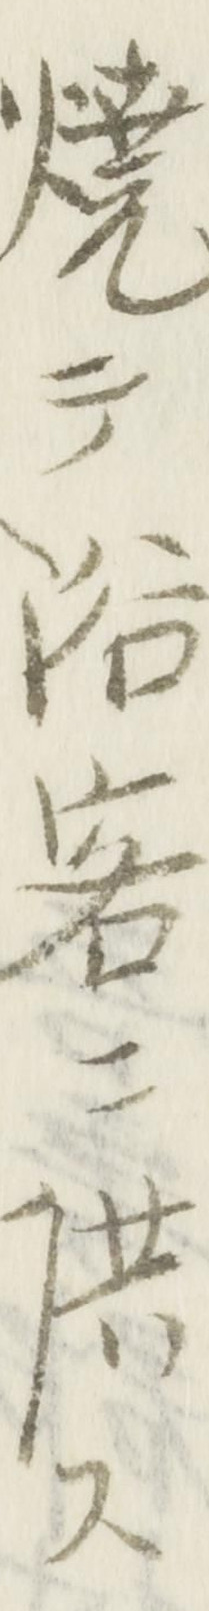焼テ浴客ニ供ス
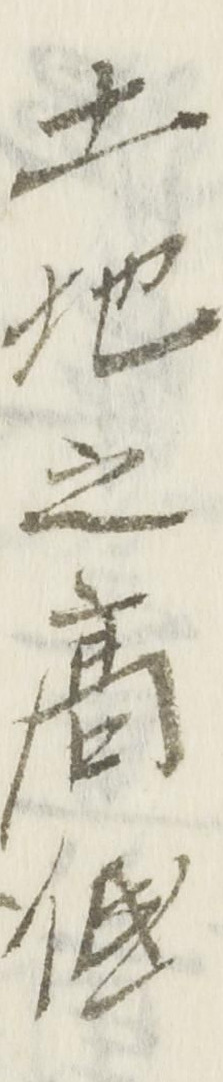土地之高低
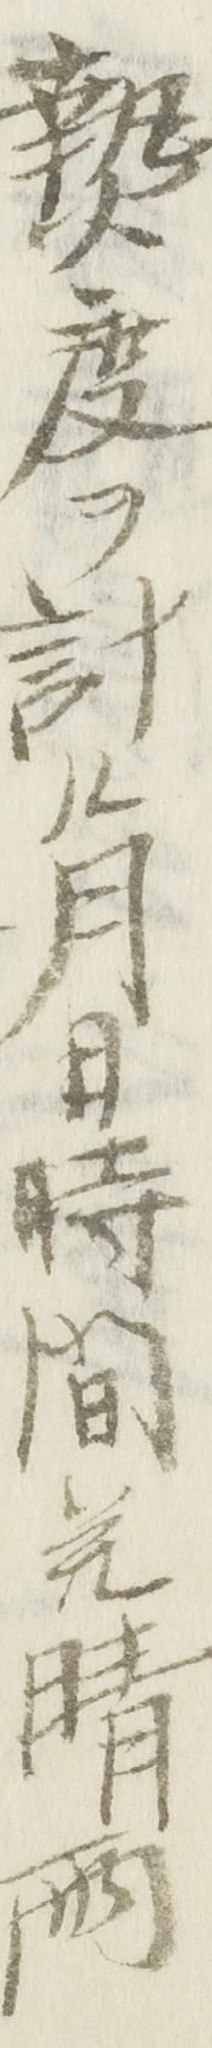熱度ヲ計ル月日時間并晴雨
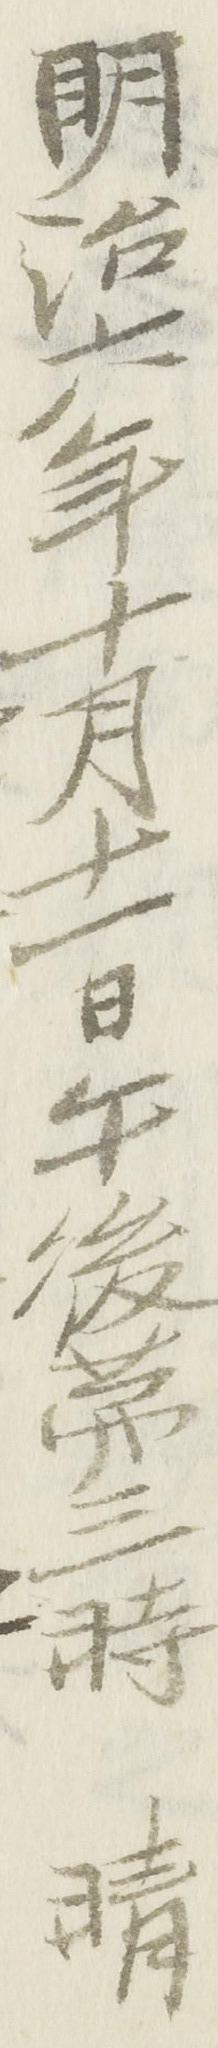明治六年十月十一日午後第三時晴
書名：温冷泉試験表
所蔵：東京大学地震研究所図書室 Earthquake Research Institute Library, The University of Tokyo, JAPAN
